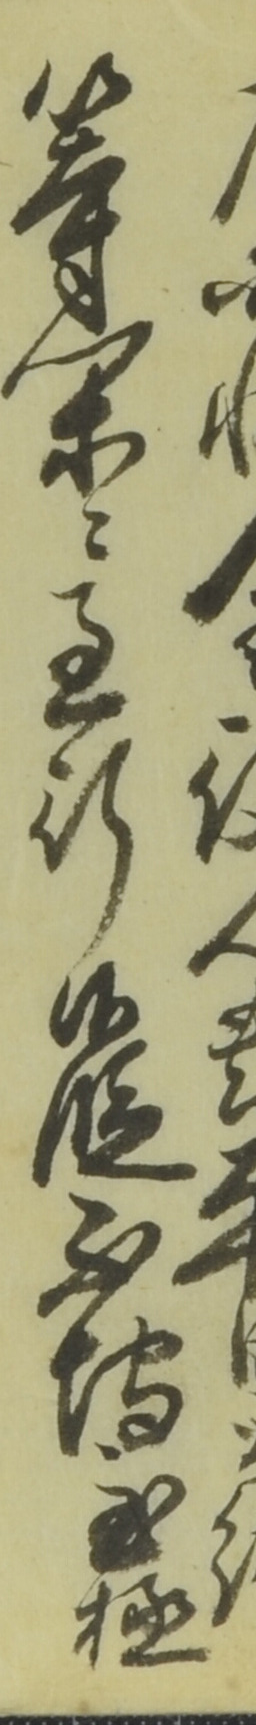等閑ニ過行候段不埒至極

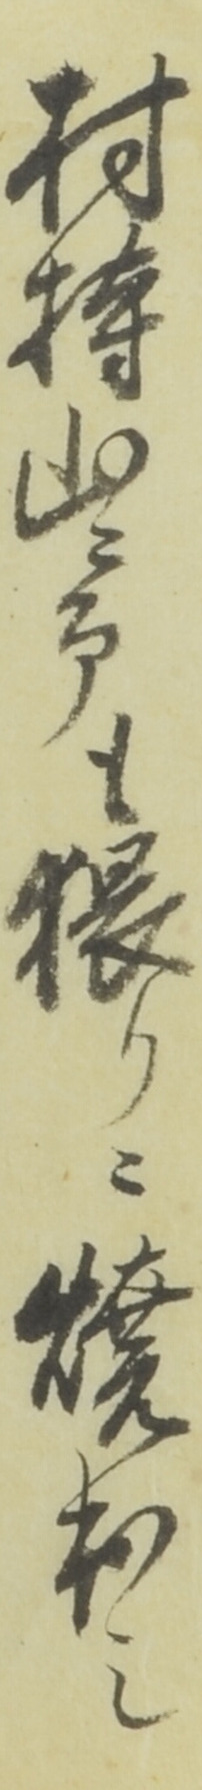村持山ニ而も猥りニ焼出し
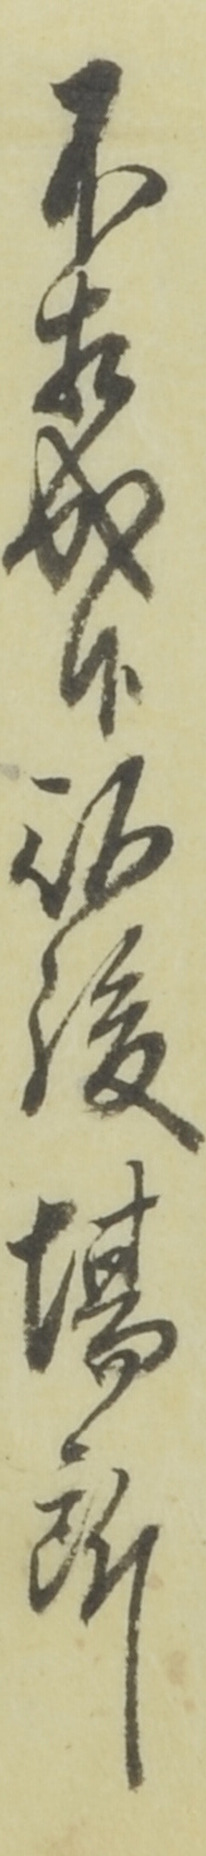不相成候以後場所
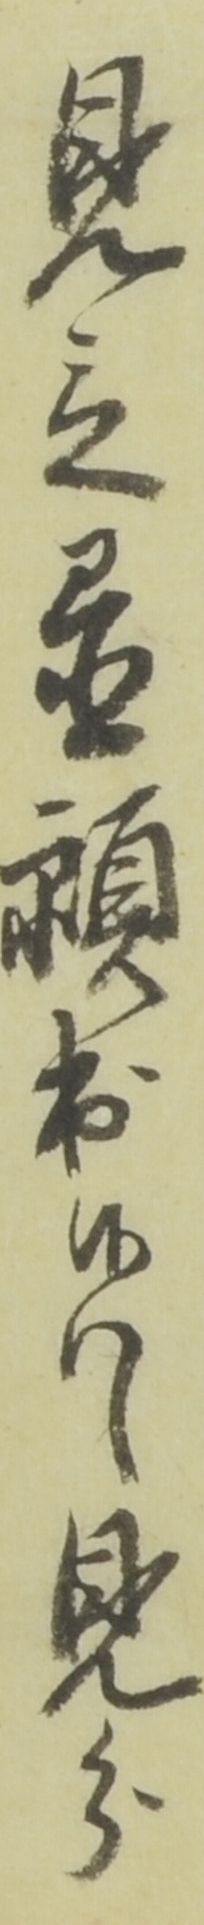見立置願出候ハヽ見分
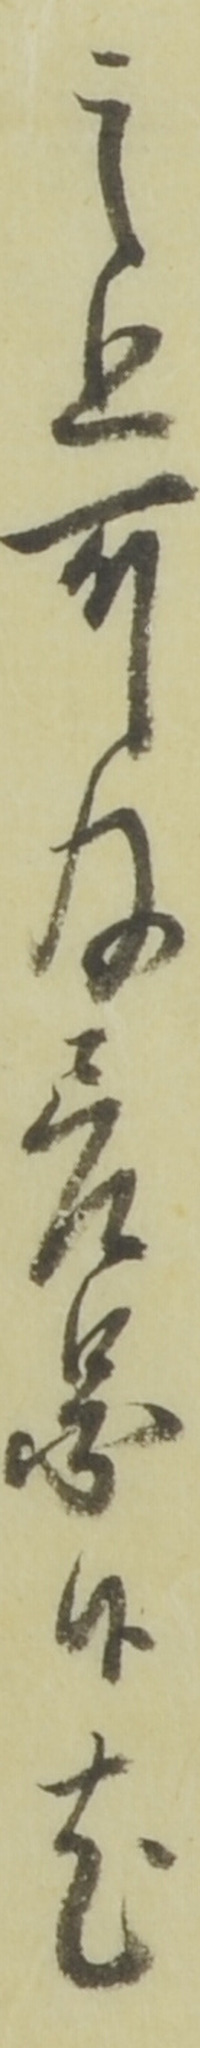之上可及差図候尤
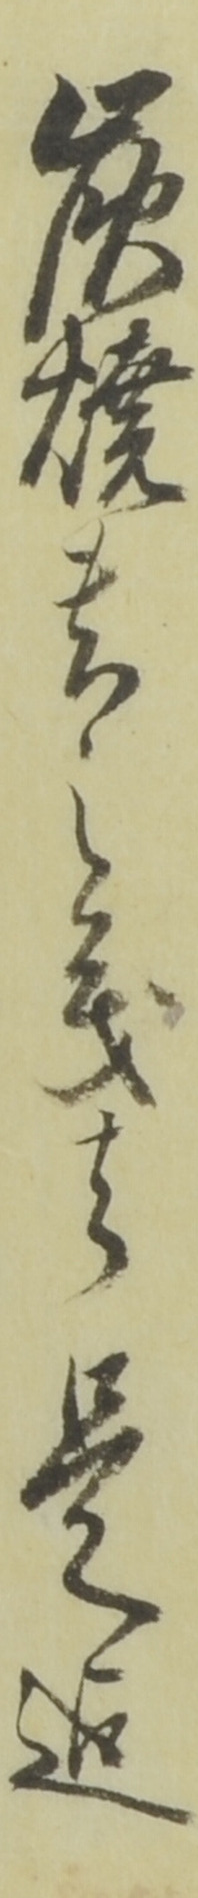炭焼共之義は是迄
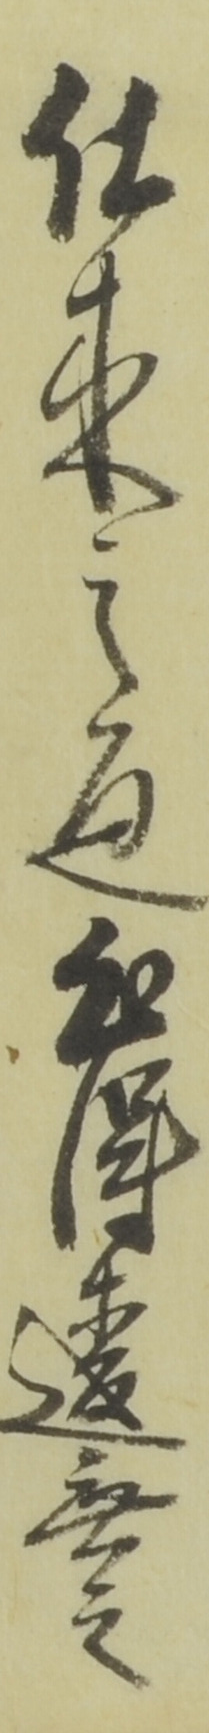仕来之通心得違無之
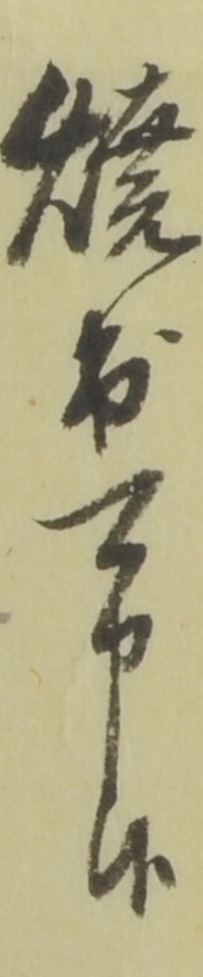焼出可申候
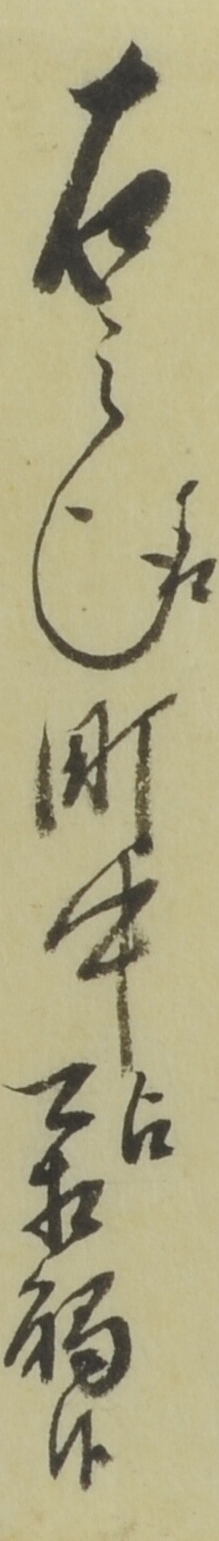右之趣町中江可相触候
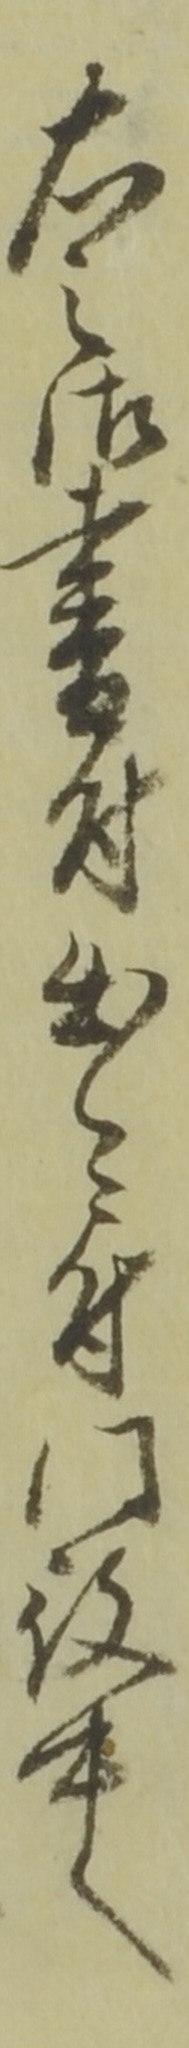右之御書付出候ニ付同役中へ
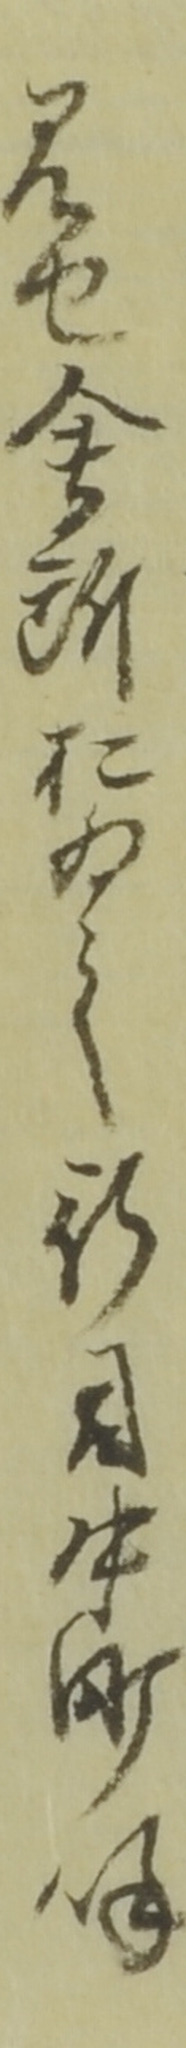見せ会所おゐて行司中町呼
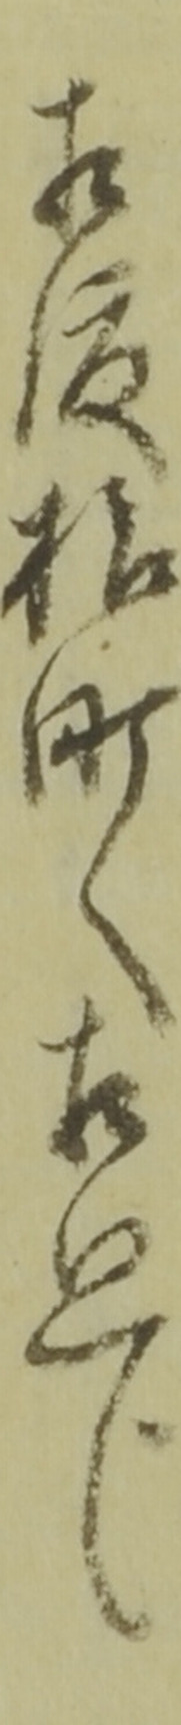相渡拾町へ相廻申候
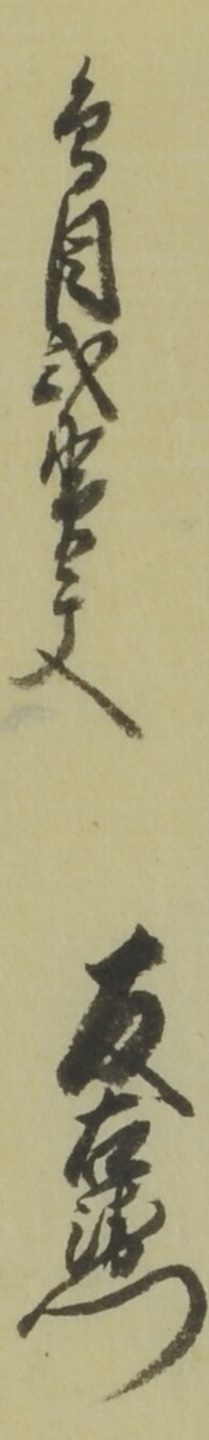鳥目弐貫文友右衛門
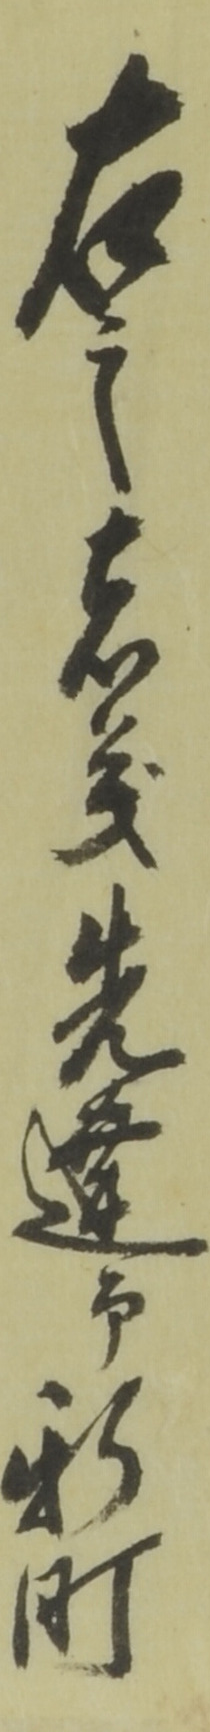右之者義先達而新町
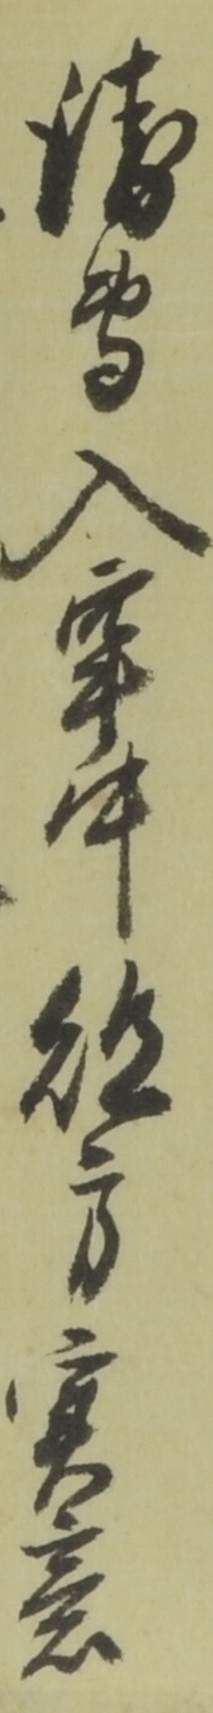勝専入窂中賄方実意
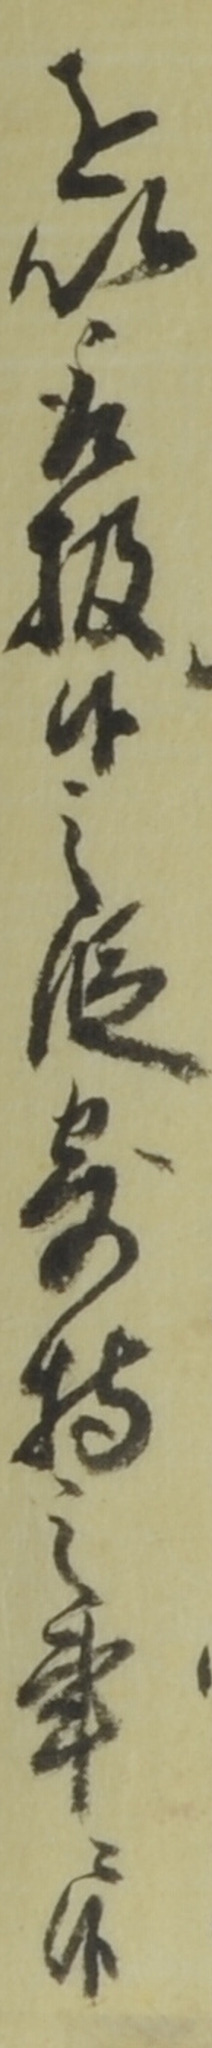を以取扱候之段奇特之事ニ候
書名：御触書御書附控
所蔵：伊那市立高遠町図書館・合同会社AMANE
